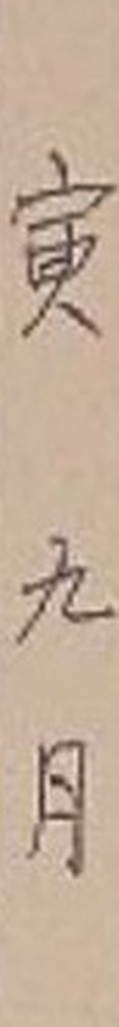寅九月
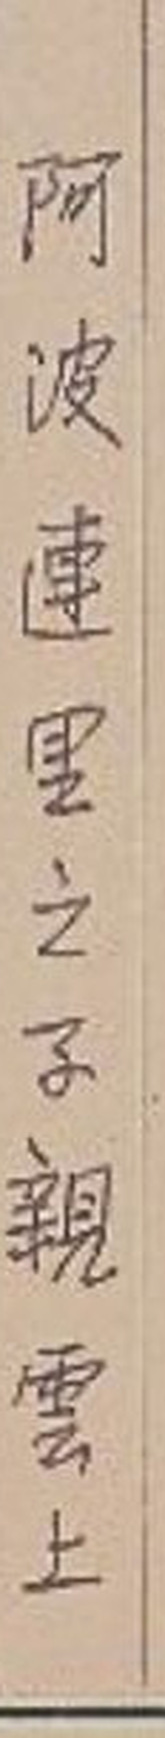阿波連里之子親雲上
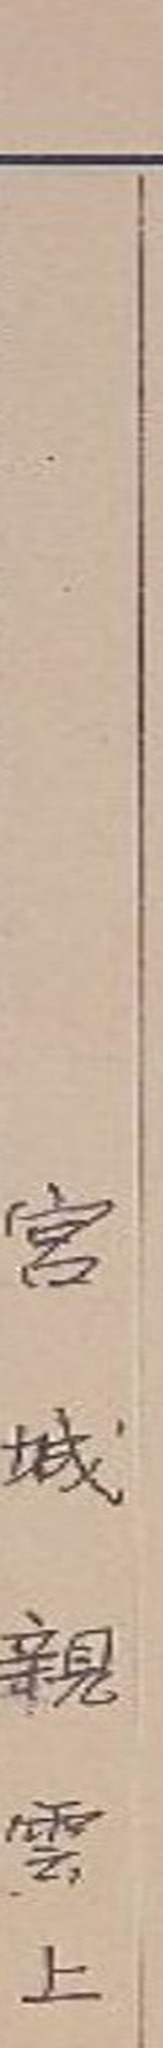宮城親雲上
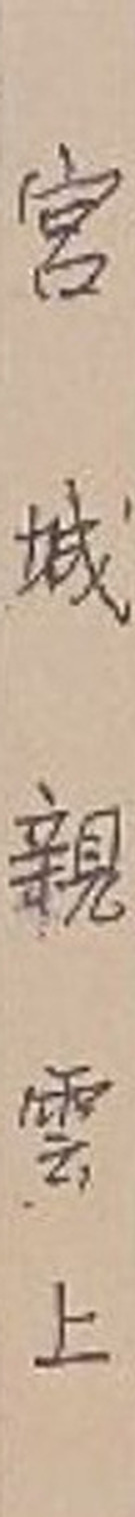宮城親雲上
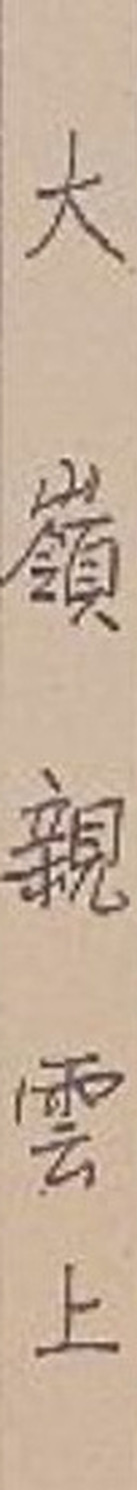大嶺親雲上
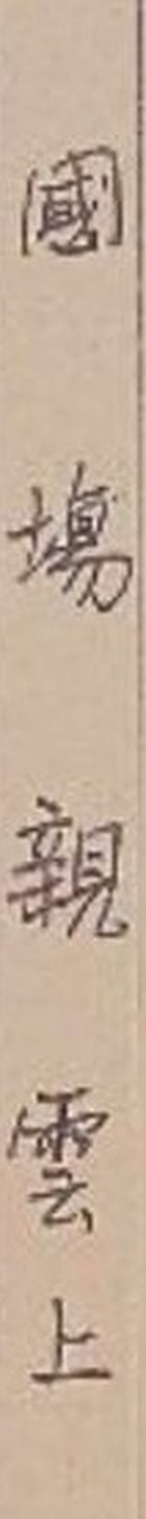国場親雲上
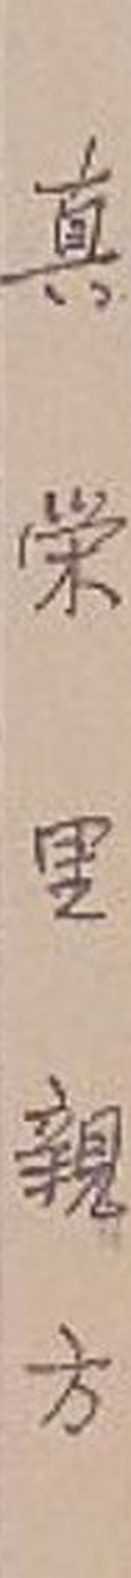真栄里親方

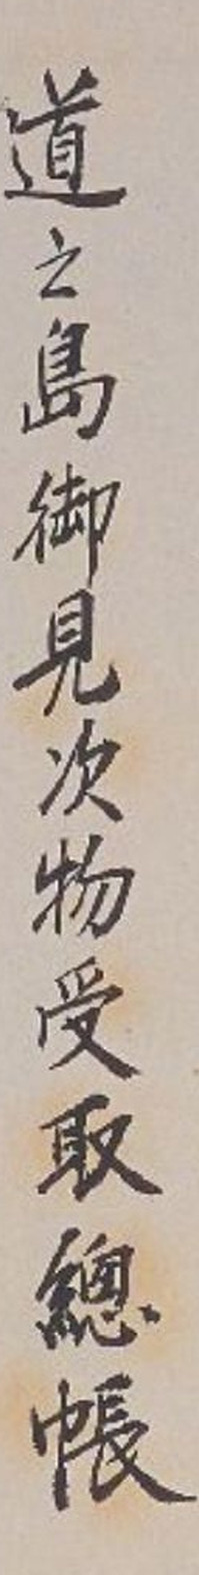道之島御見次物受取総帳

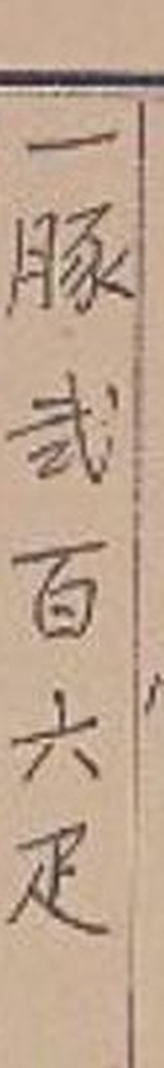一豚弐百六疋
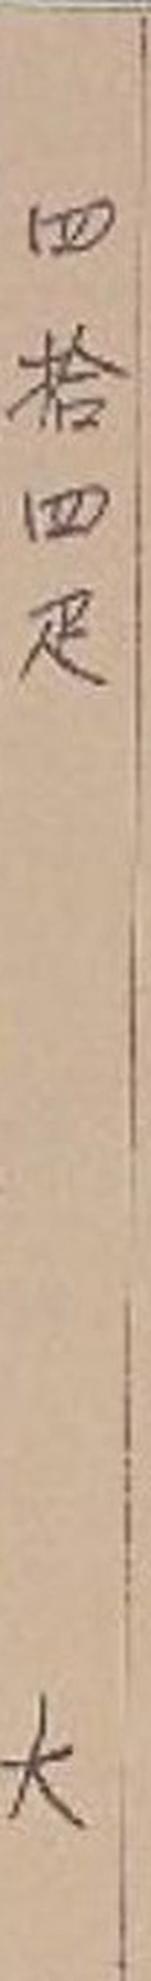四拾四疋大島
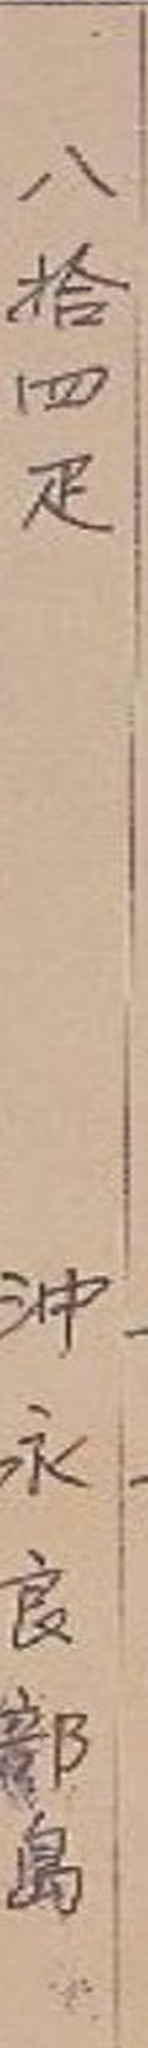八拾四疋沖永良部島
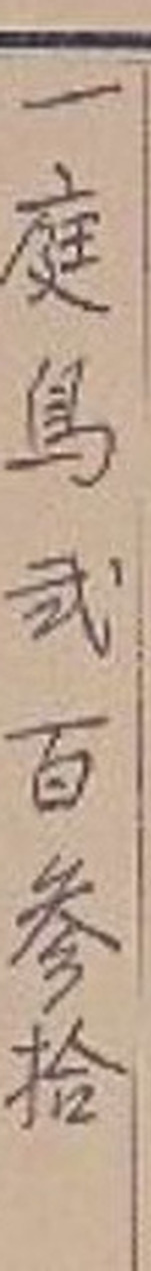一庭鳥弐百参拾
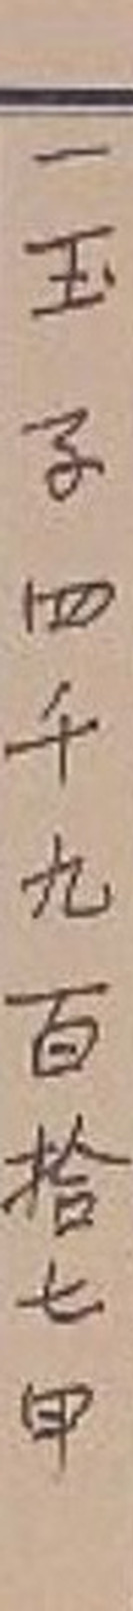一玉子四千九百拾七甲

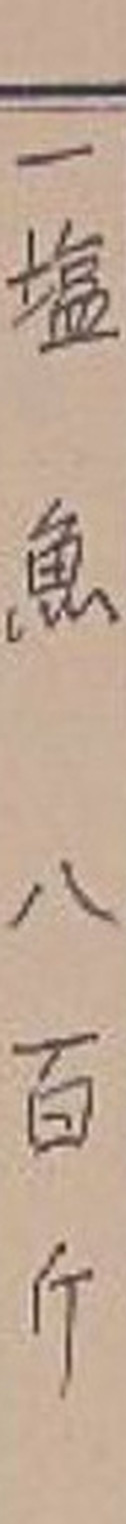一塩魚八百斤
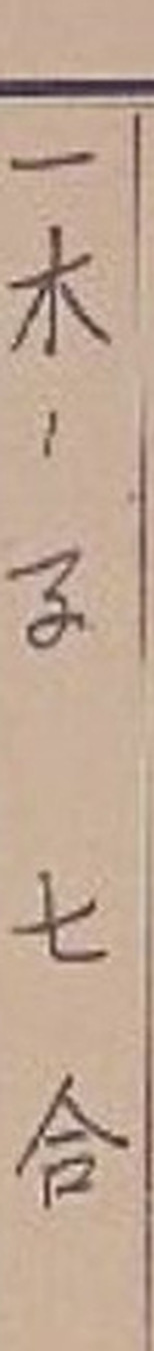一木の子七合
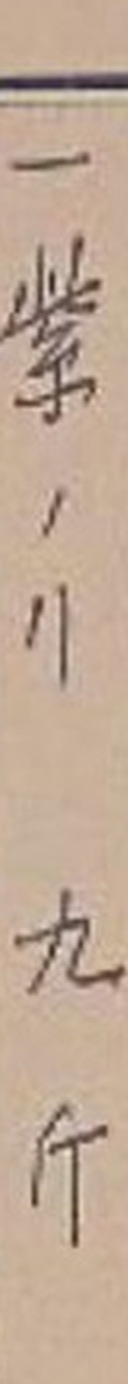一紫のり九斤
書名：支那冊封使来琉諸記 下巻
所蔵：University of the Ryukyus Library
